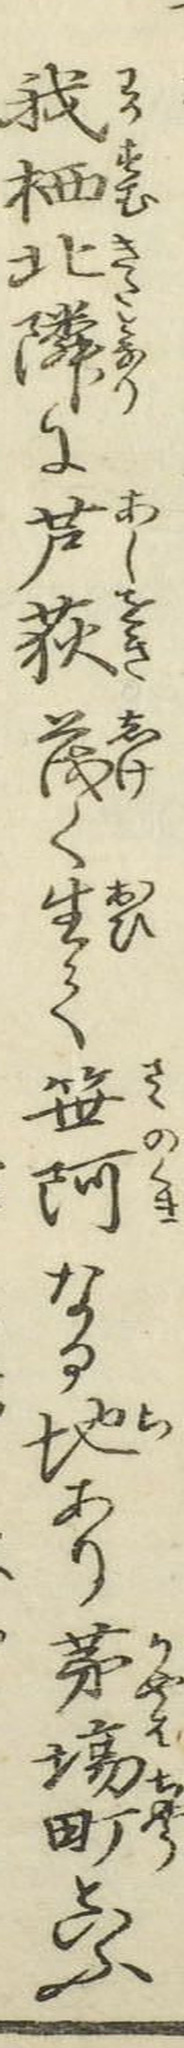我栖北隣に芦荻茂く生て笹阿なる地あり茅場町といふ
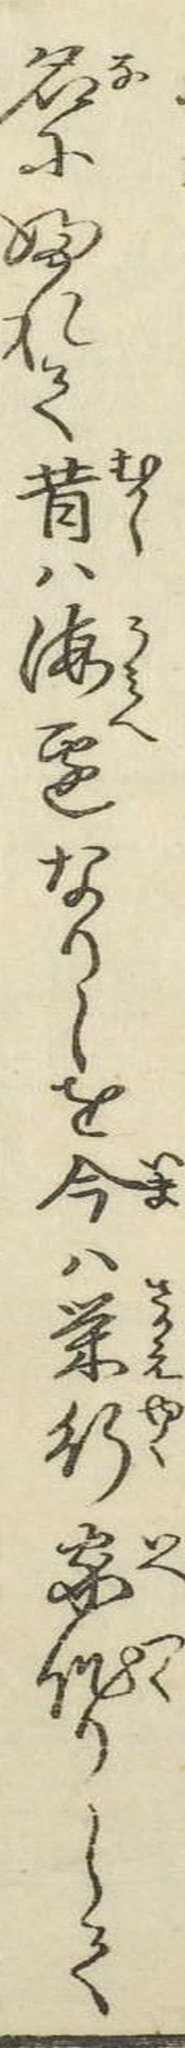名にふれて昔は海邊なりしを今は栄行家作りして
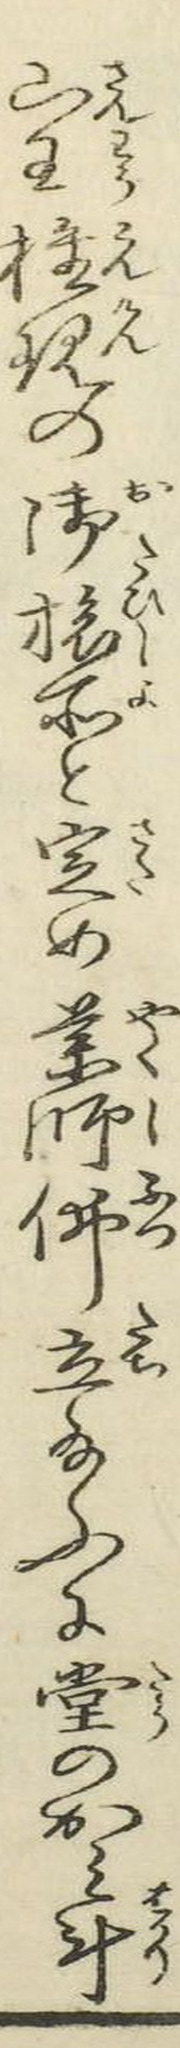山王権現の御旅所と定め薬師佛立給ふに堂のかみ斗
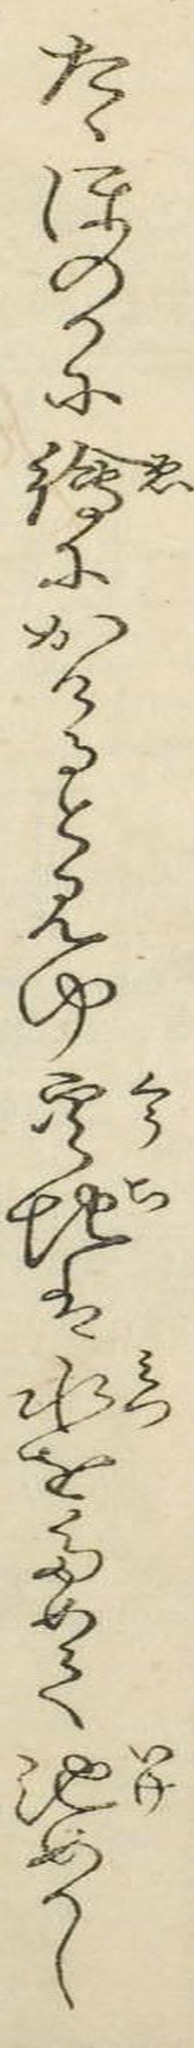たゝほのかに繪にかけると見ゆ空地は水をためて池めかし
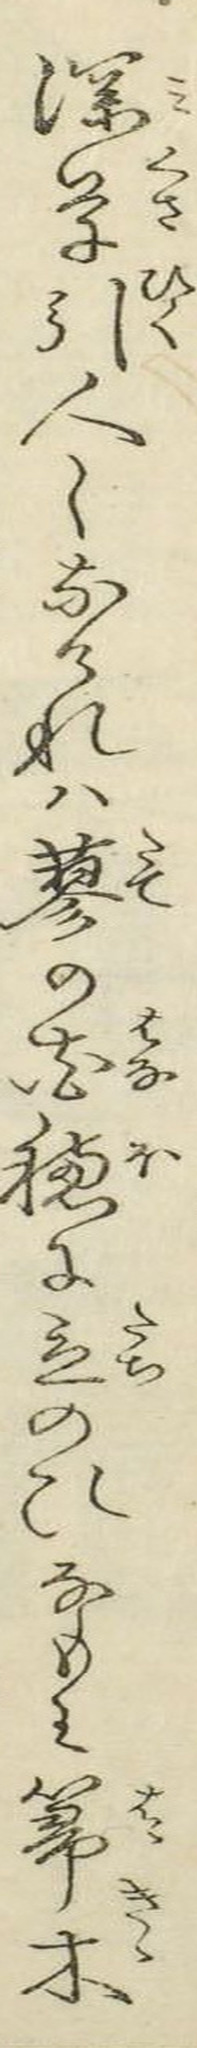深草引人しなけれは蓼の花穂に立のひなも箒木
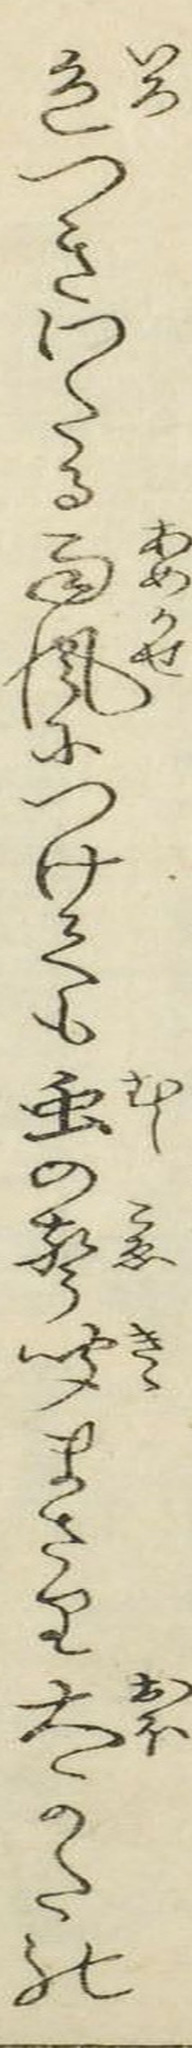色つきわたる雨風につけても虫の聲聞まさり大かたの
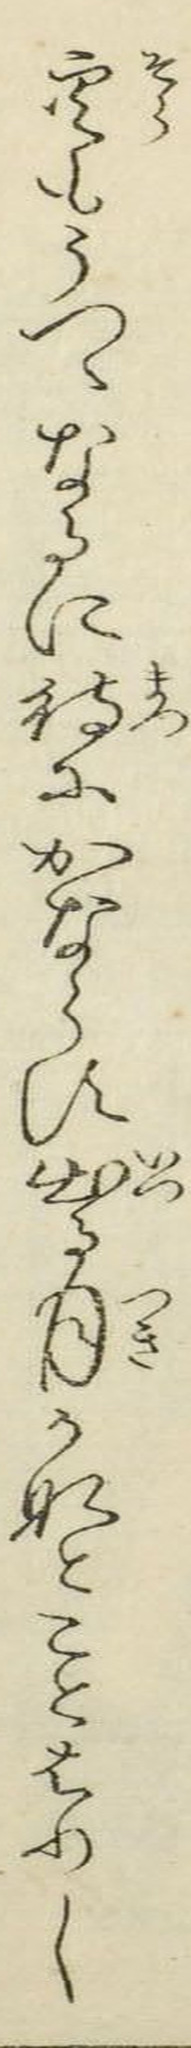空もうつゝなるに待にかならす出る月かなとことはりし
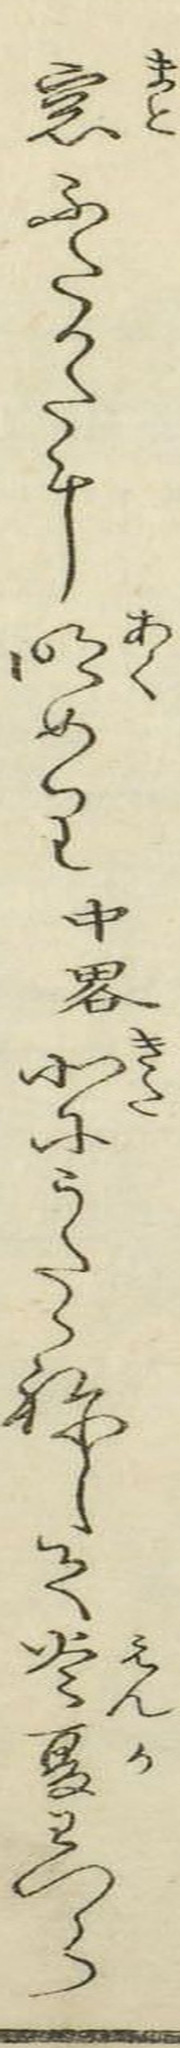窓ふたかたに明めり中略北にうたゝねして炎夏わつら
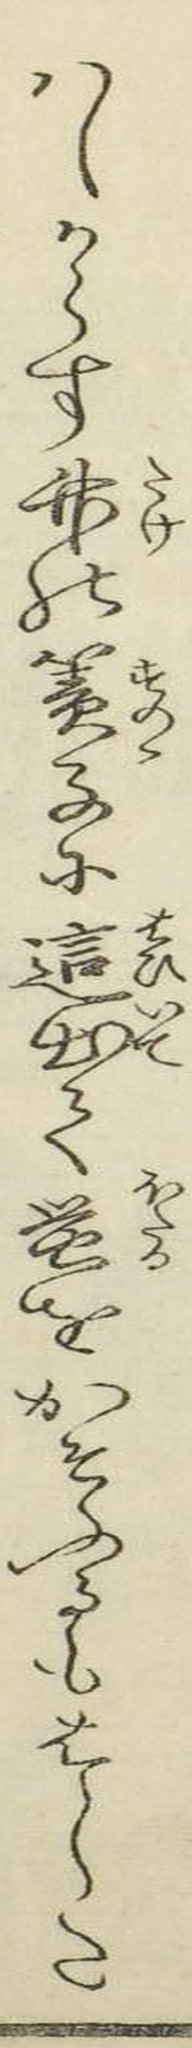はしからす竹の簀子に這出て蛍をかそふるもはした
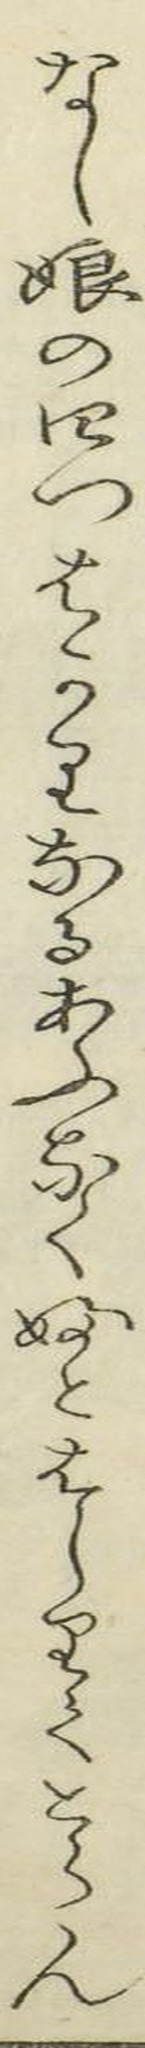なし娘の四つはかりなるあふなくふとはしりてとらん
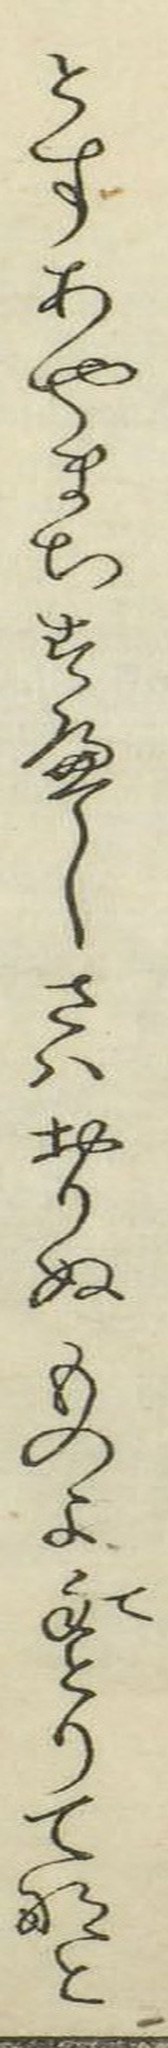とすあやまちすへしさはおりぬものよ手とりてなと
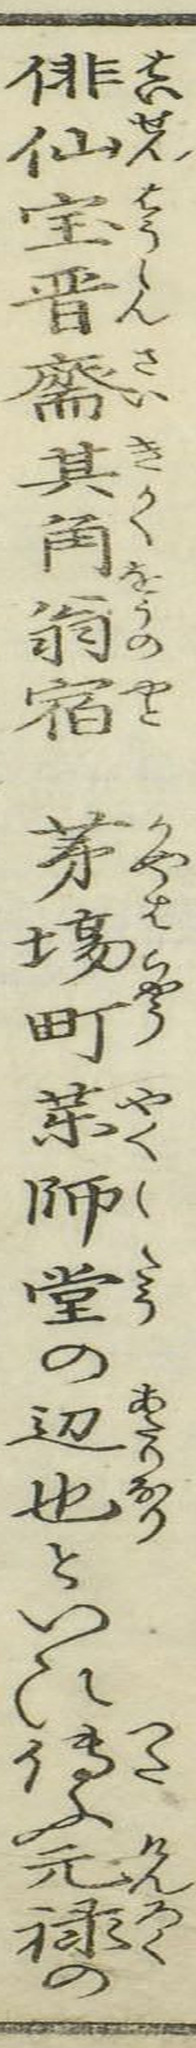俳仙宝晋斎其角翁宿茅場町薬師堂の辺也といひ傳ふ元禄の
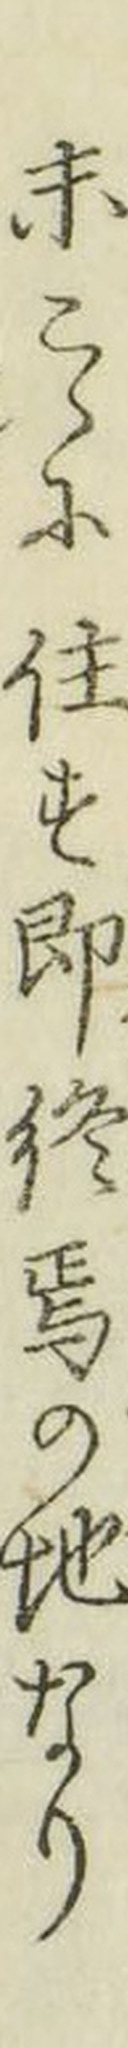末こゝに住す即終焉の地なり
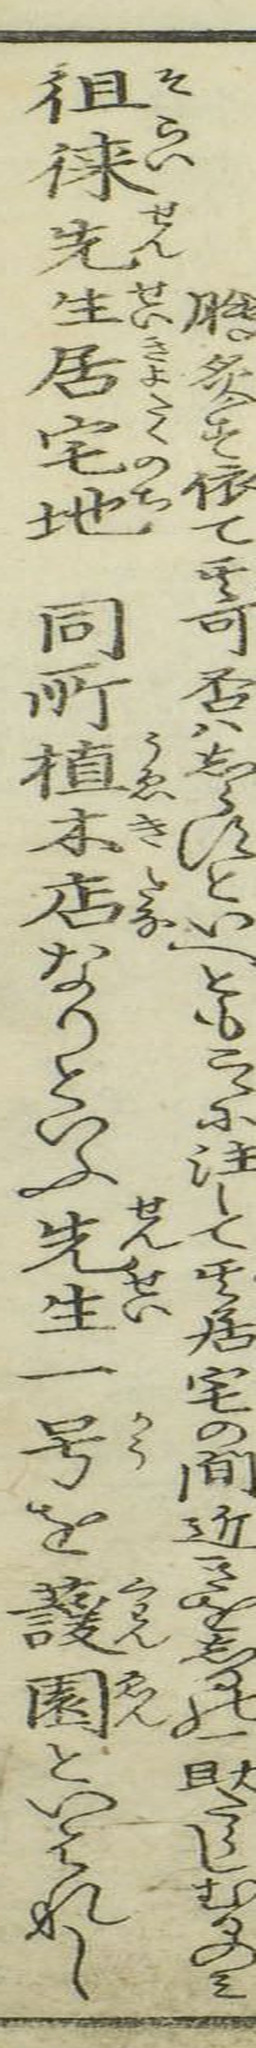徂徠先生居宅地同所植木店なりといふ先生一号を蘐園といはれし

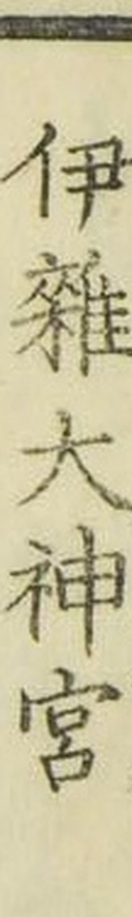伊雑大神宮
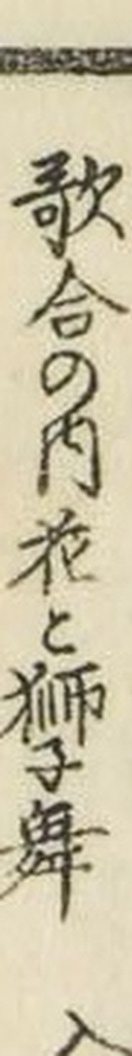歌合の内花と獅子舞
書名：江戸名所図会 20巻 巻之2
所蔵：東京学芸大学教育コンテンツアーカイブ
